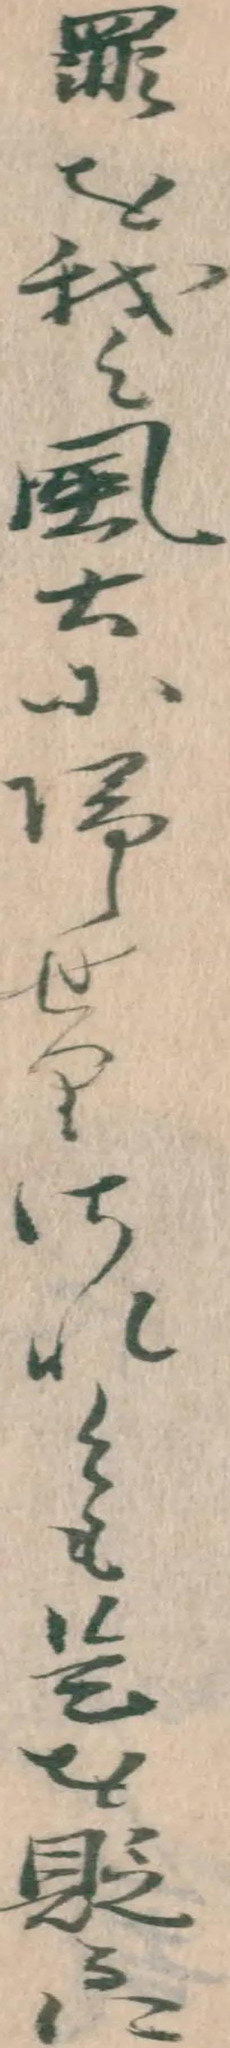罪をそ風大小帰せりそれとも是を敗るに
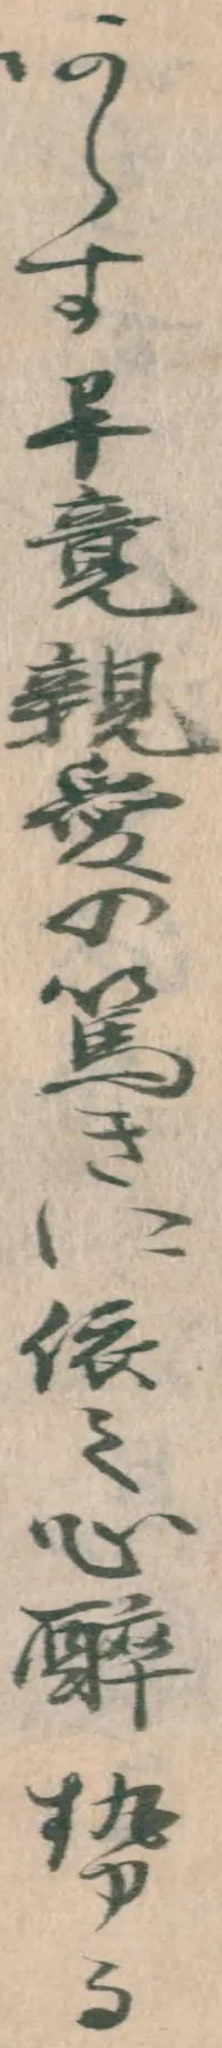あらす畢竟親愛の驚きに依て心酔せる
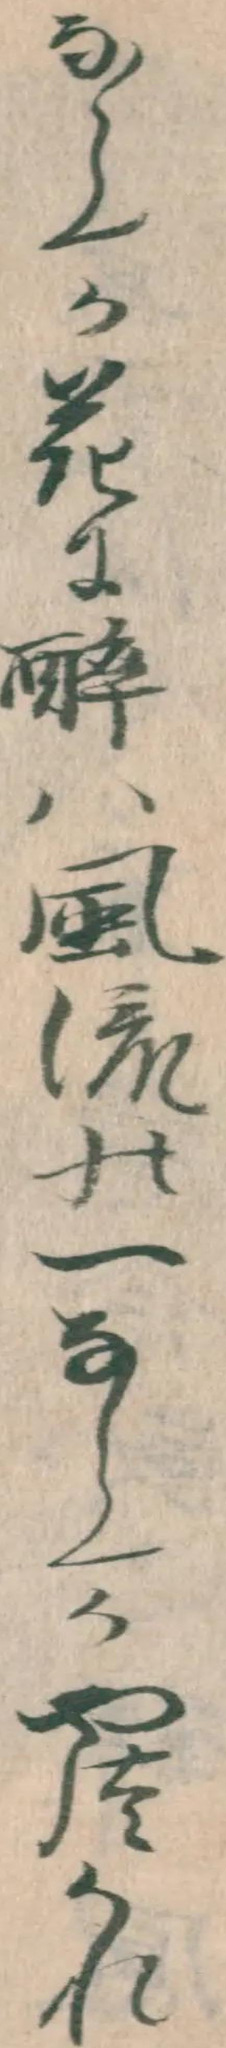ならんか花に酔ハ風流の一ならんかやつかれ
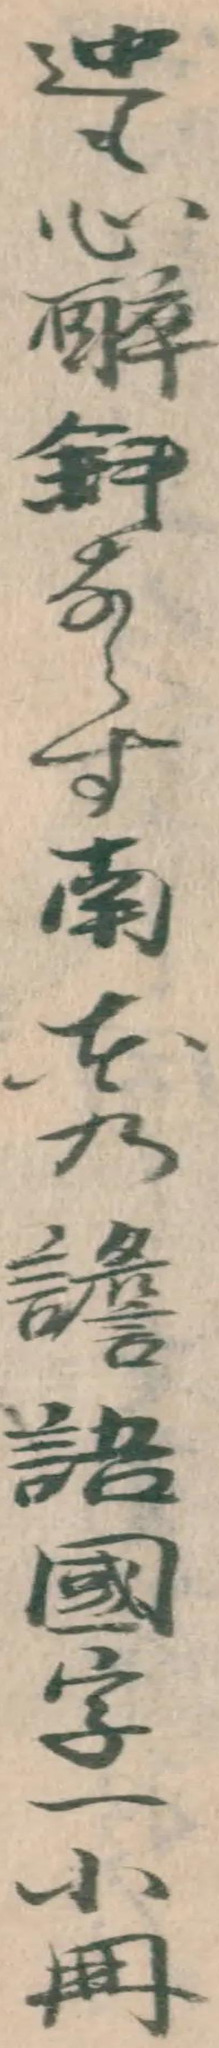迚も心酔斜ならす南本の譫語国字一小冊
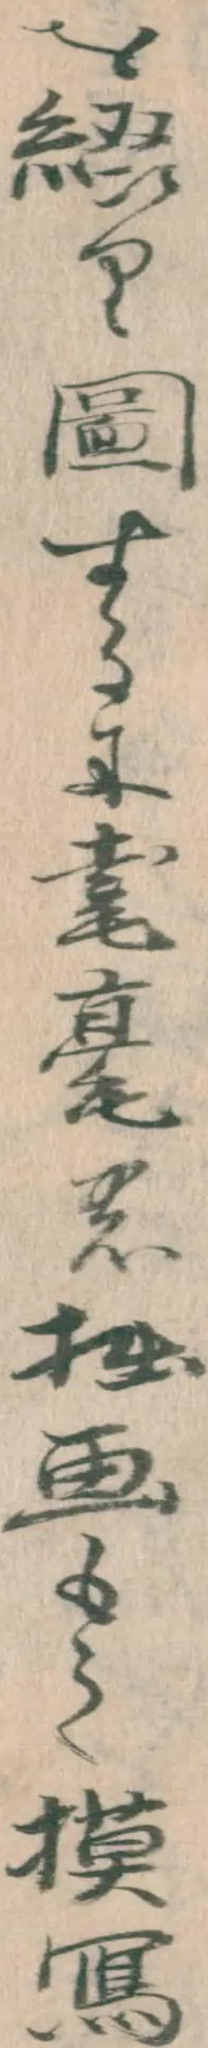を綴り図するに君拙画もて模写
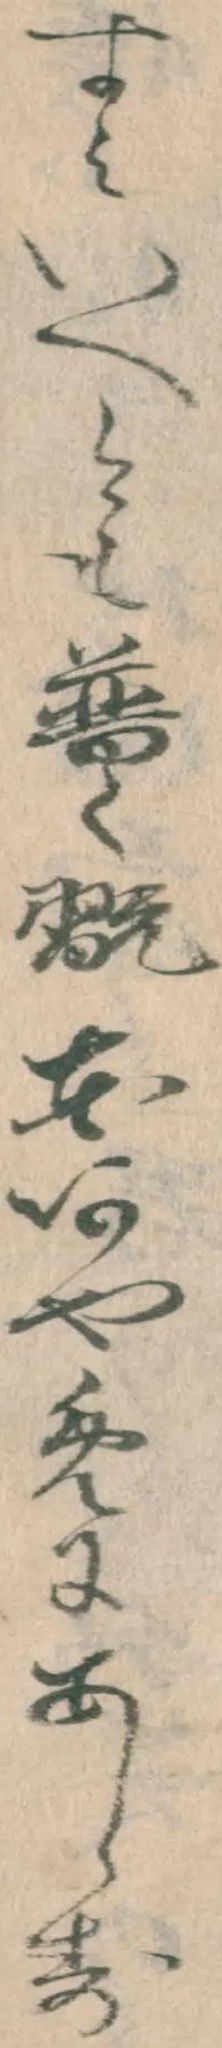すといへとも普く翫花あやめにあらす
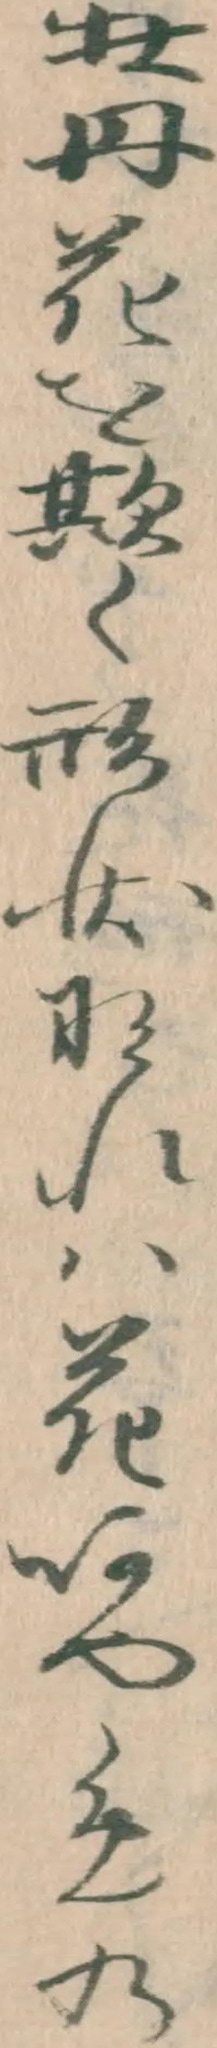牡丹花を欺く形状なれハ花あやめの

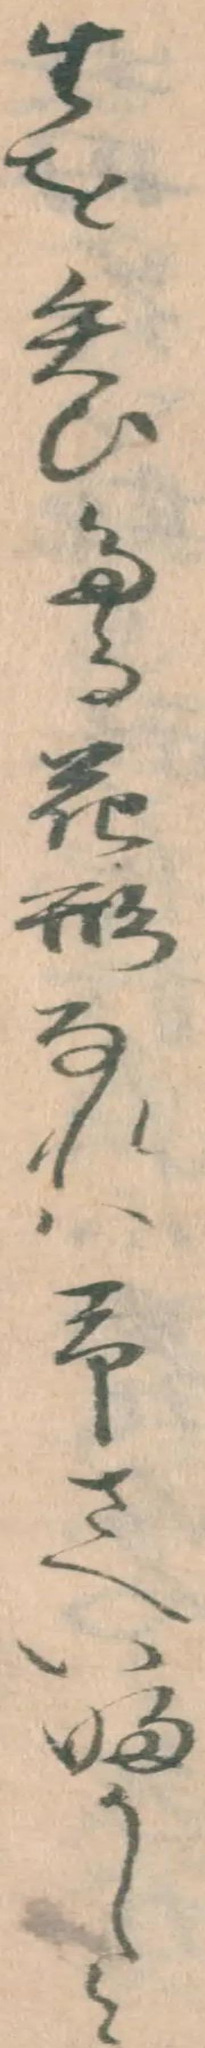生を失ひたる花形なれハ予さへいふかしと
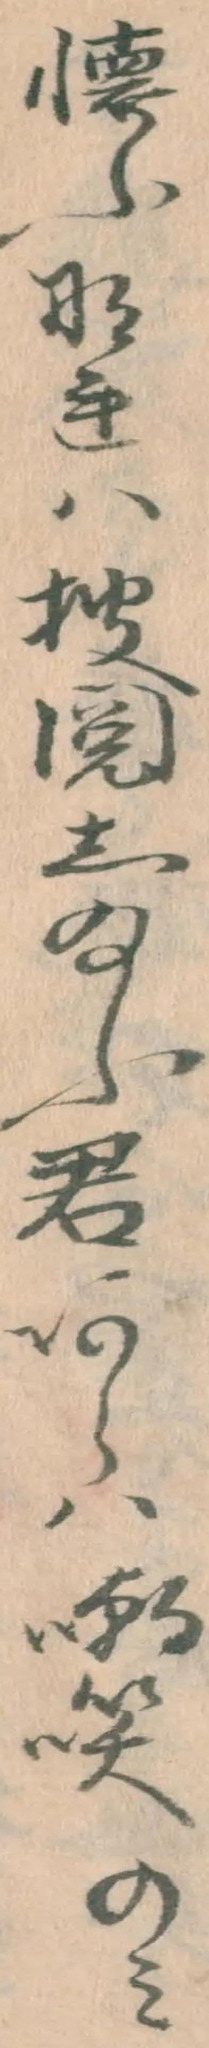貝懐ふなれハ被閲し給ふ君あらハ嘲笑のミ
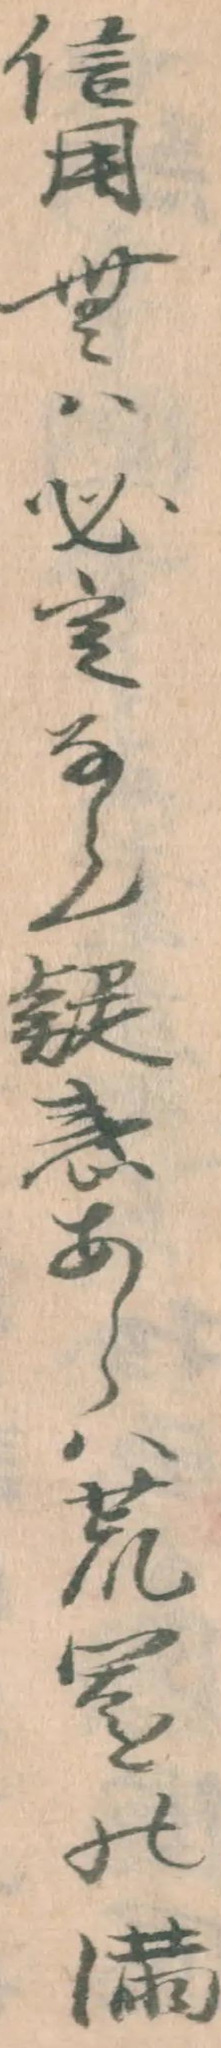信用無ハ必定ならん疑義あらハ荒岡の備
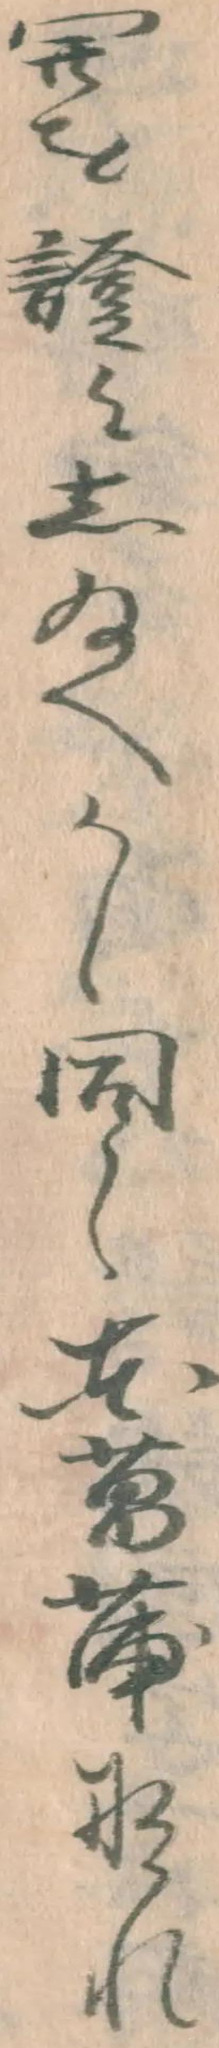開を證とし給へかし同し花菖蒲なれ
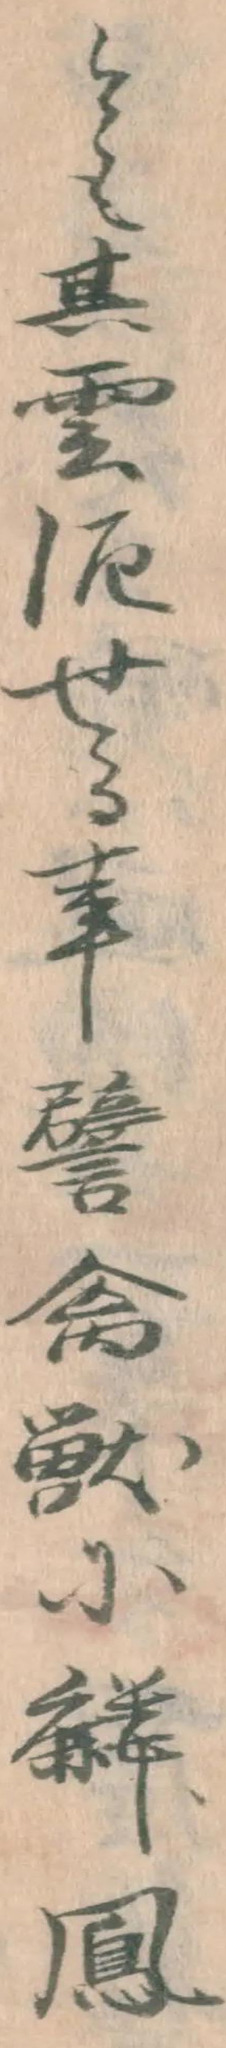とも其雲泥せる事譬禽獣に麟鳳
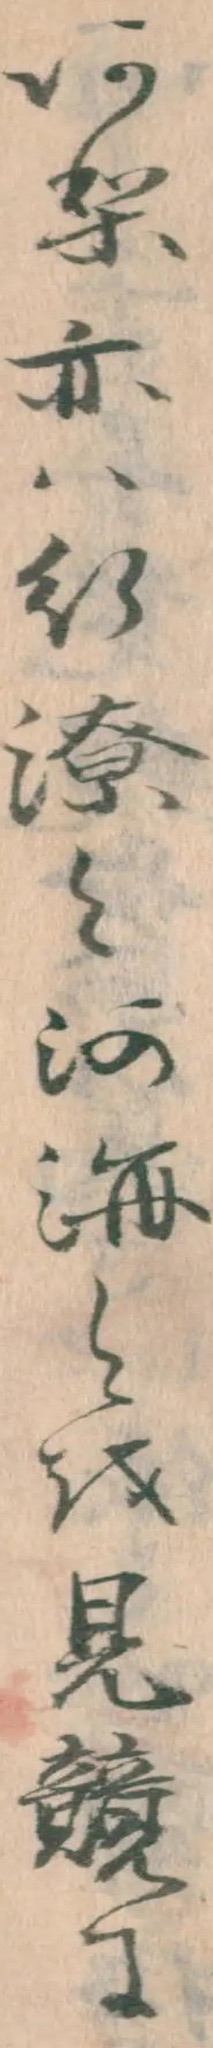あり亦ハ行潦と河海とを見競に
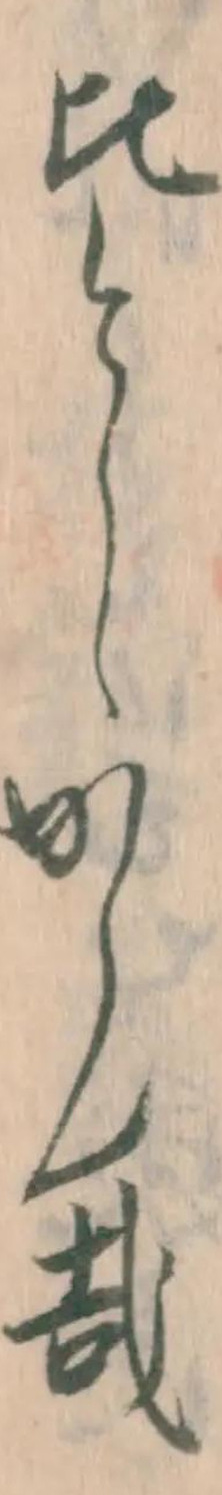比としかゝん哉
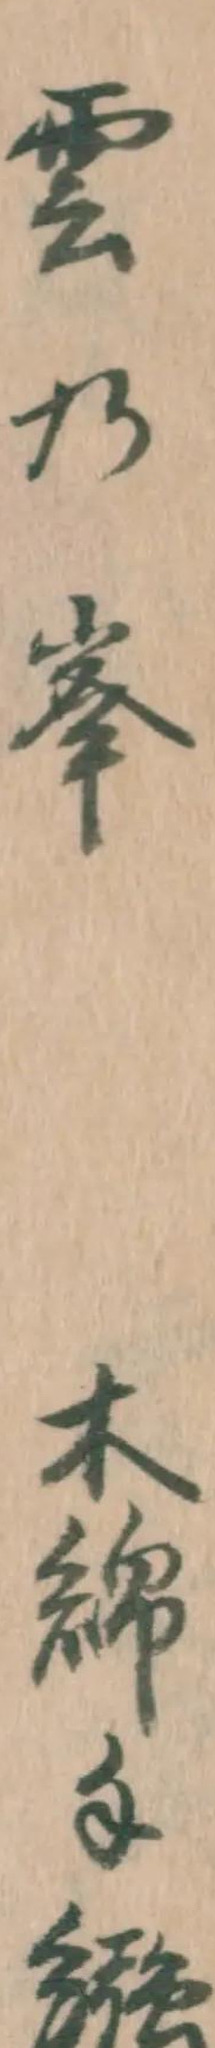雲の峯木綿手拭

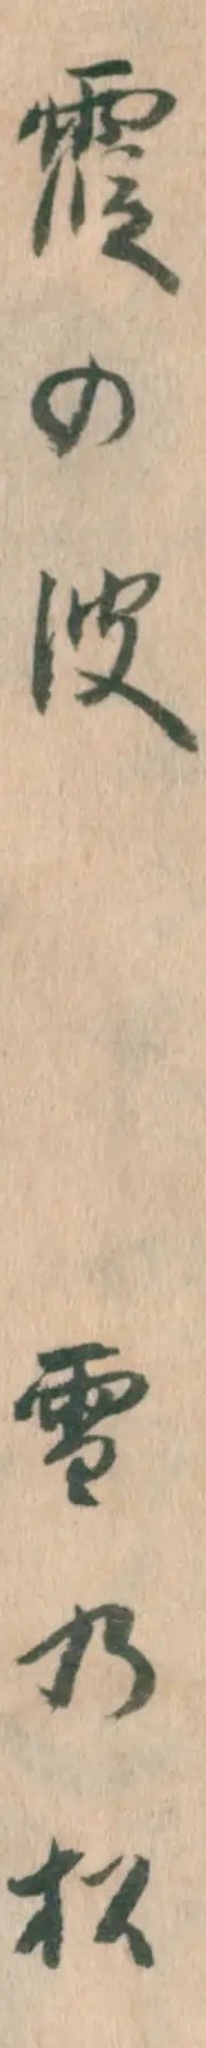霞の波雪の杦
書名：花菖培養録
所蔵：国立国会図書館 National Diet Library, JAPAN
